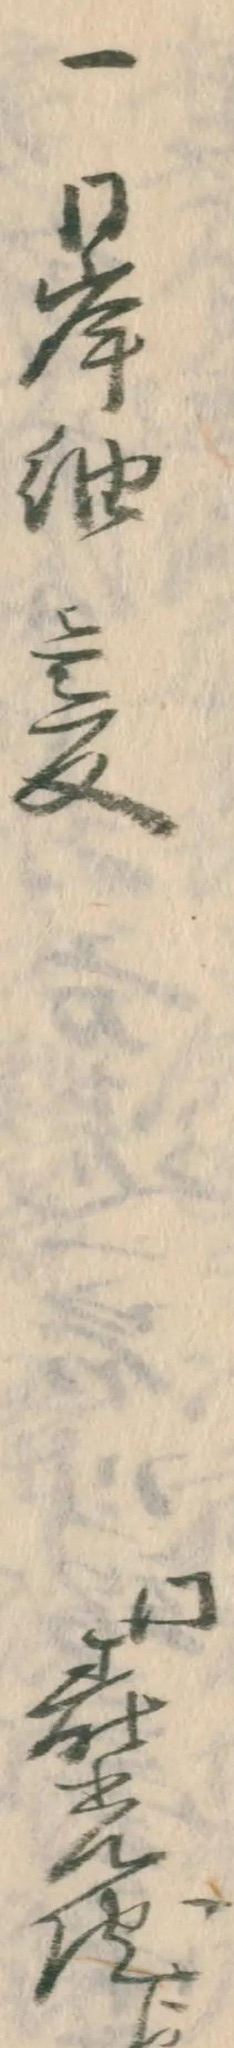一日岸紬壱反同表光院ゟ
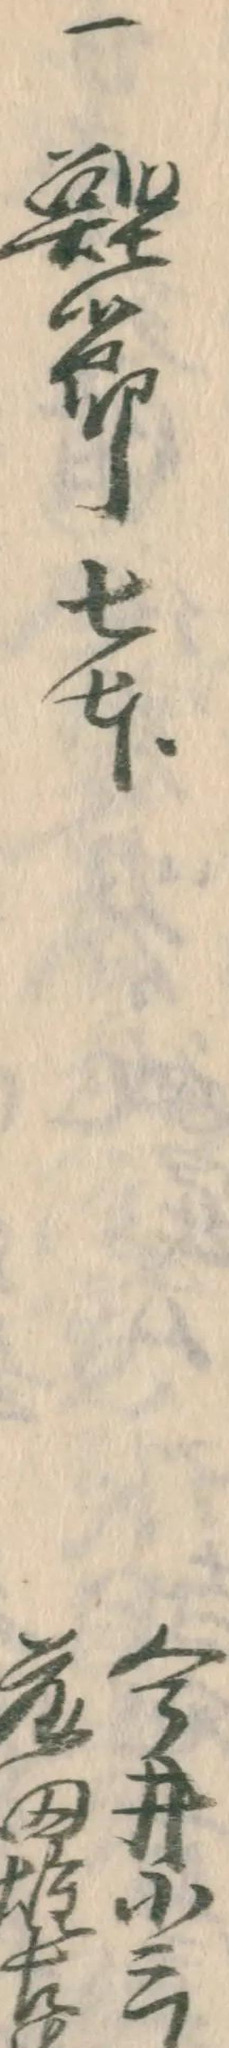一鰹節七本今井小三郎ゟ
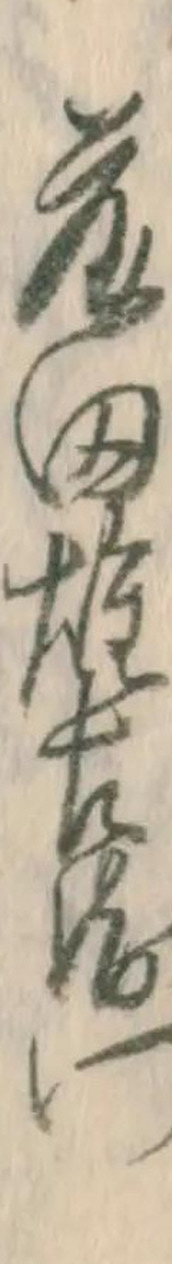藤田雄左衛門
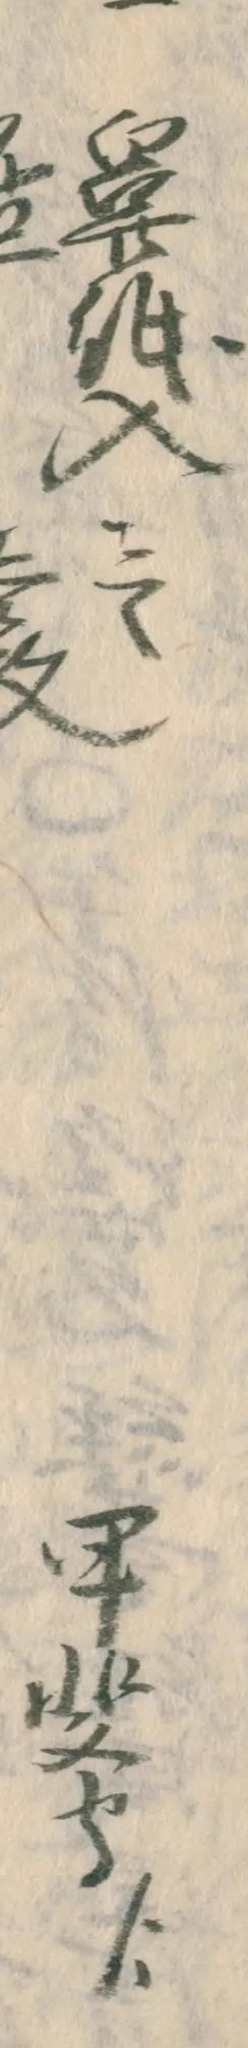一鼻紙入壱甲斐守ゟ
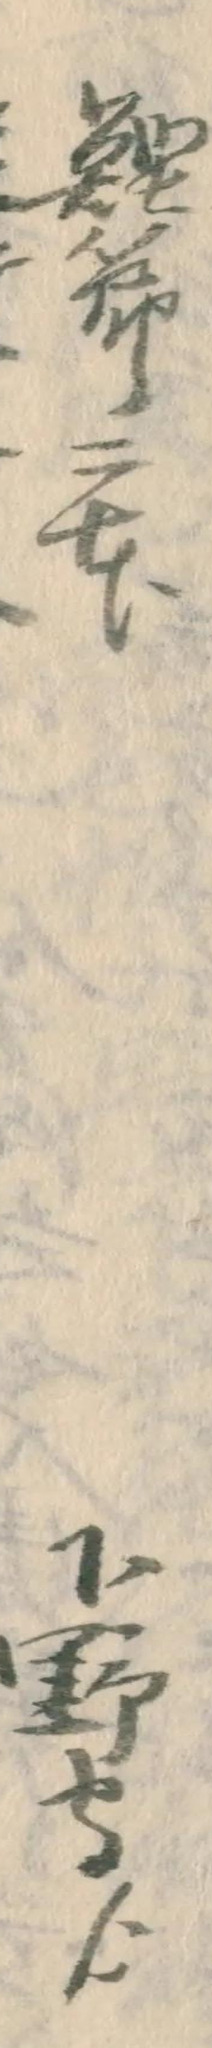一鰹節二本下野守ゟ
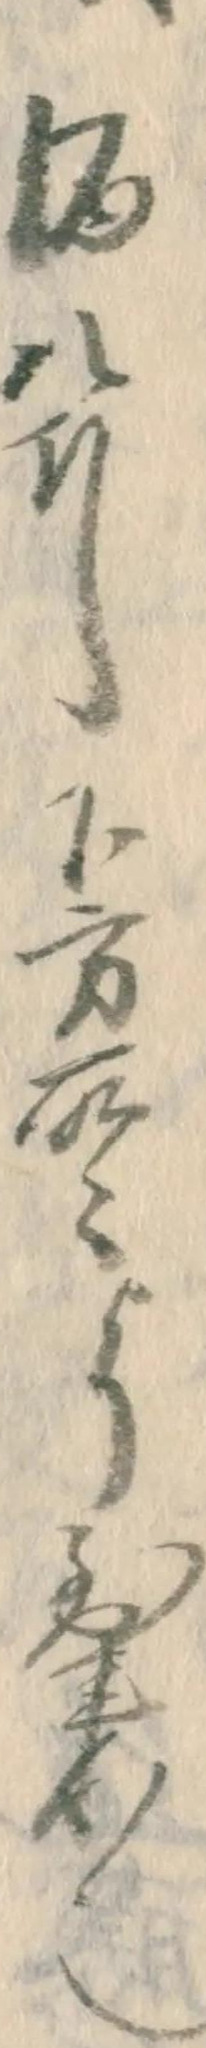外外酒八升下方所々より到来也
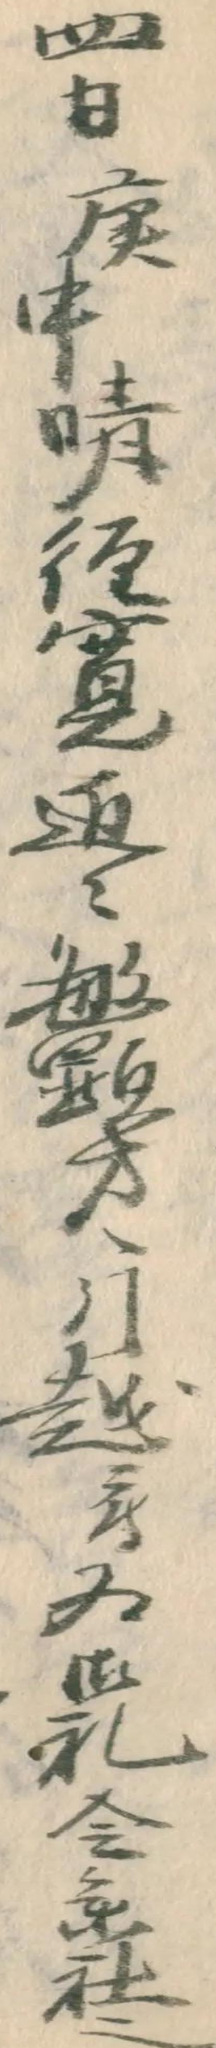四日庚申晴経寛近々敏顕方へ引越ニ付右御礼令参社也
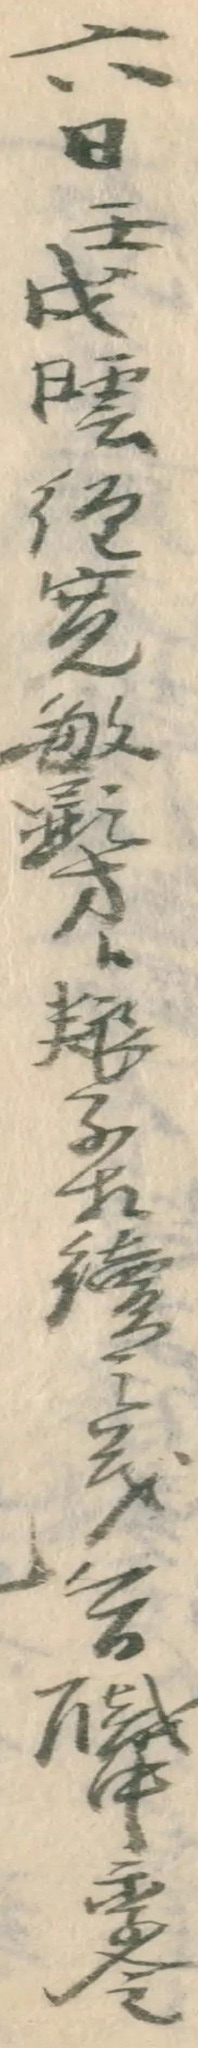六日壬戌曇経寛敏顕方え養子相續之義今日職中季令
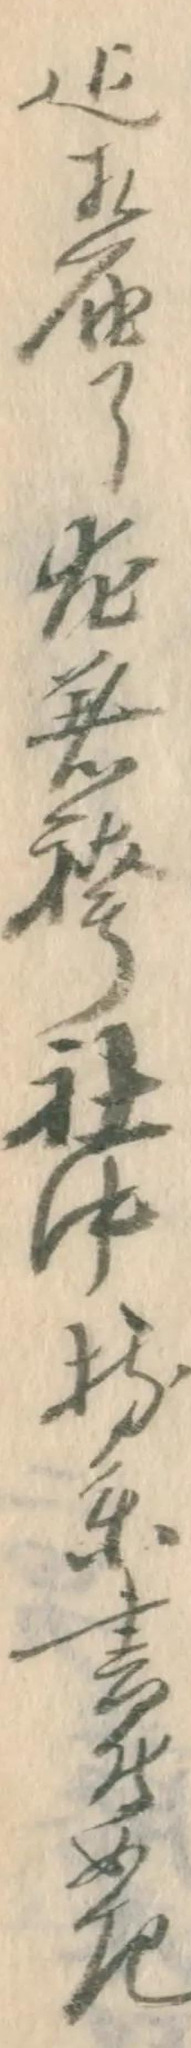迄相届了尤着袴社中へ持参書付如左

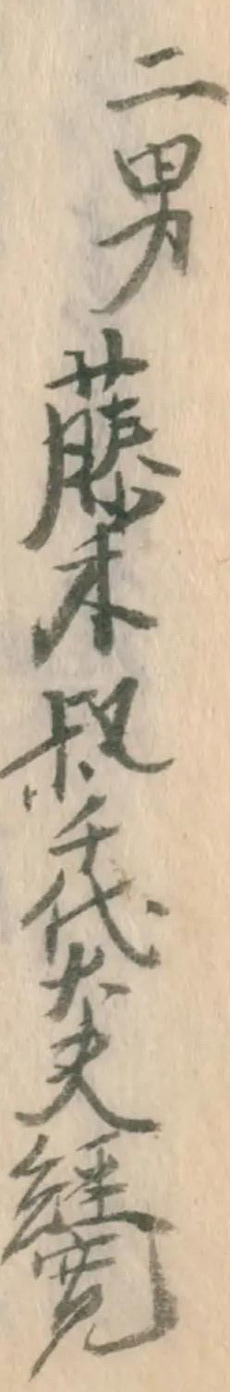二男藤木叔千代大夫経寛
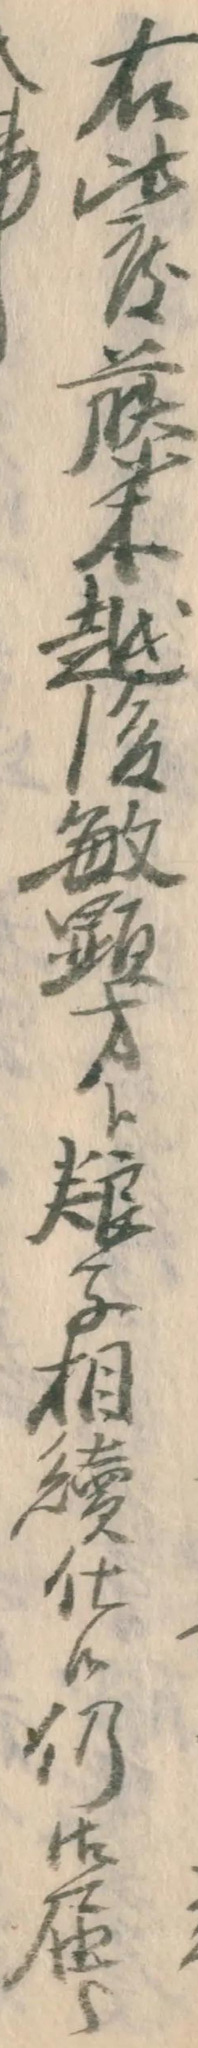右此度藤木越後敏顕方え養子相續仕候仍御届申
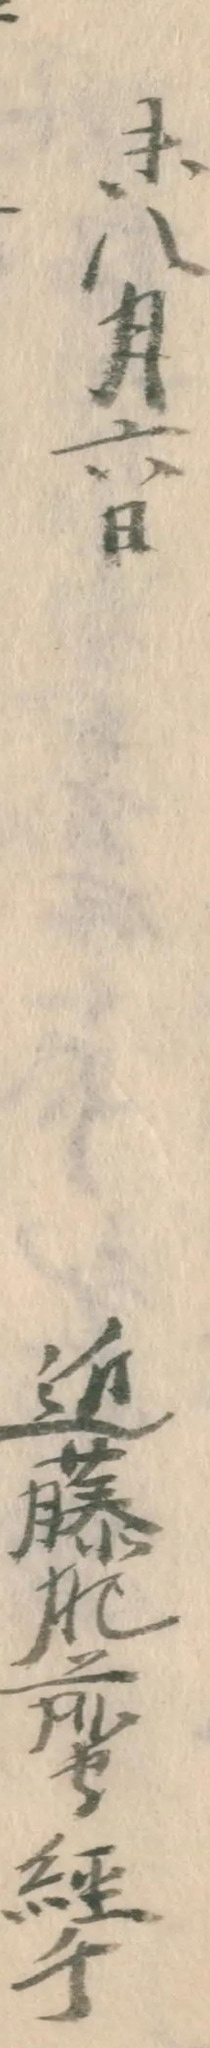未八月六日近藤肥前守経千
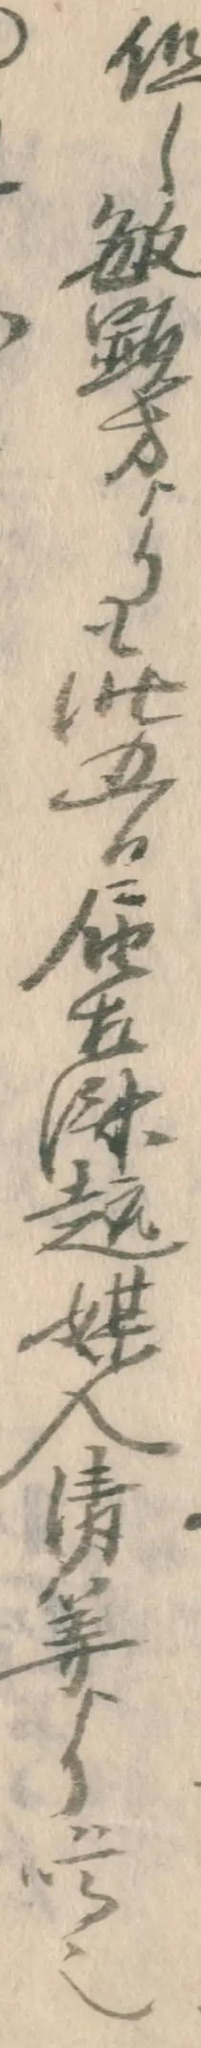但し敏顕方よりも昨五日届相済趣媒人清算より噂也
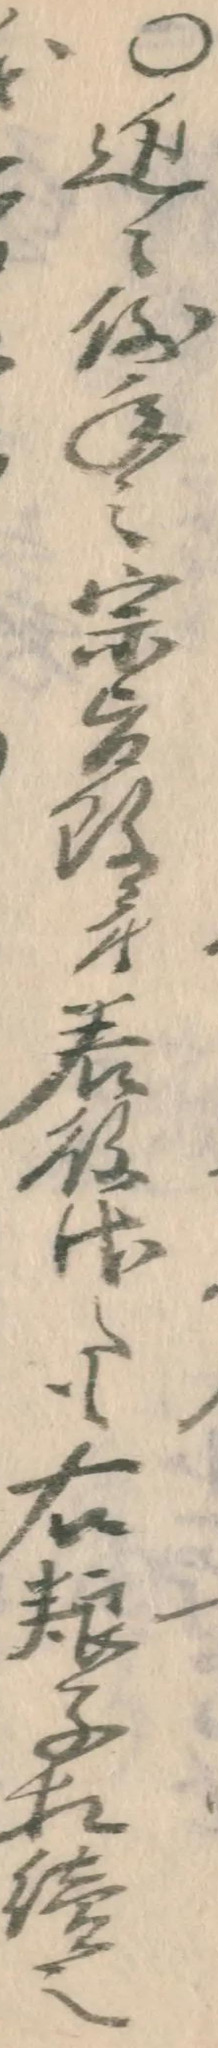○近々例年之宗旨改ニ付若殿代へも右養子相續之
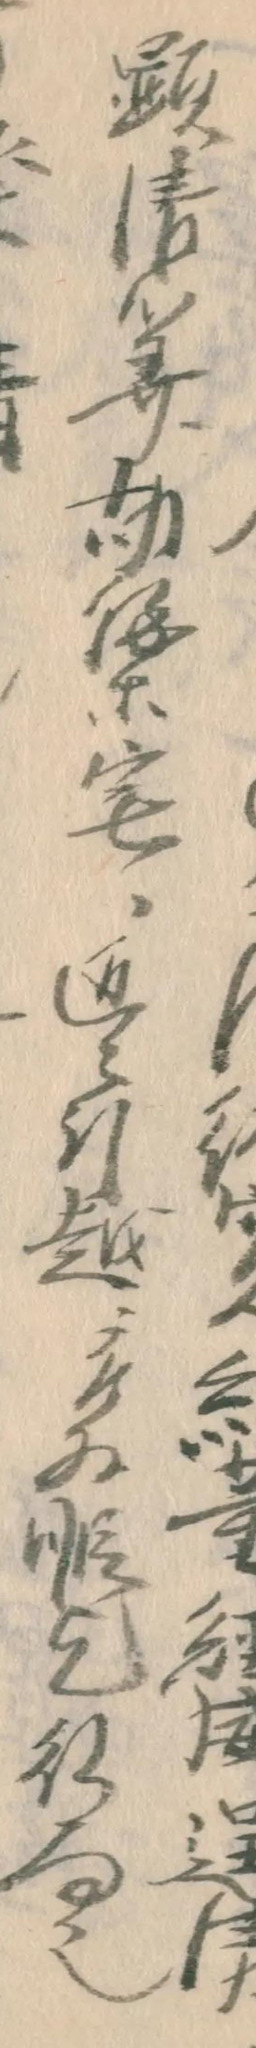顕清算胡保等宅へ近々引越ニ付為暇乞行向也
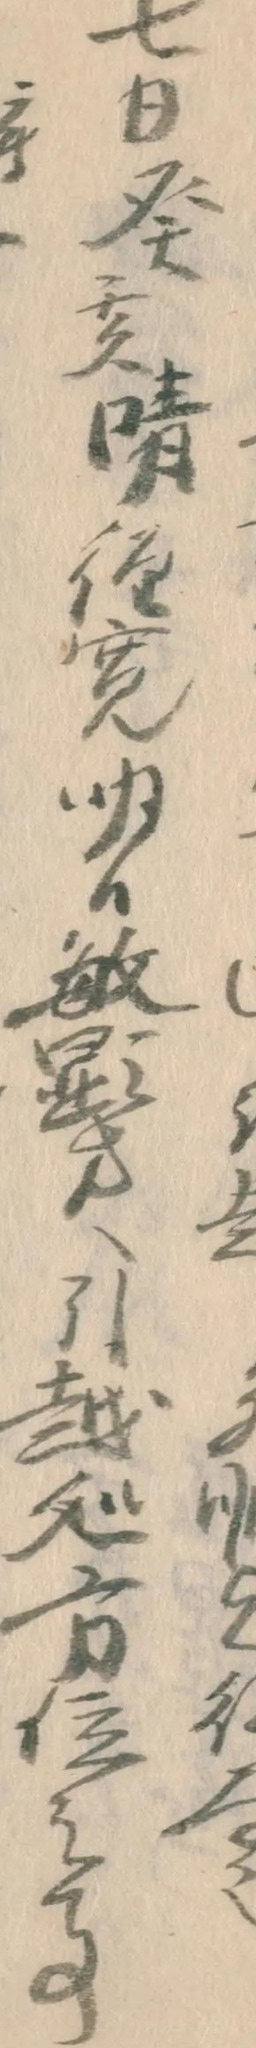七日癸亥晴経寛明日敏顕方へ引越処方位之事
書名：賀茂社記録. 第67冊
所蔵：国立国会図書館 National Diet Library, JAPAN
